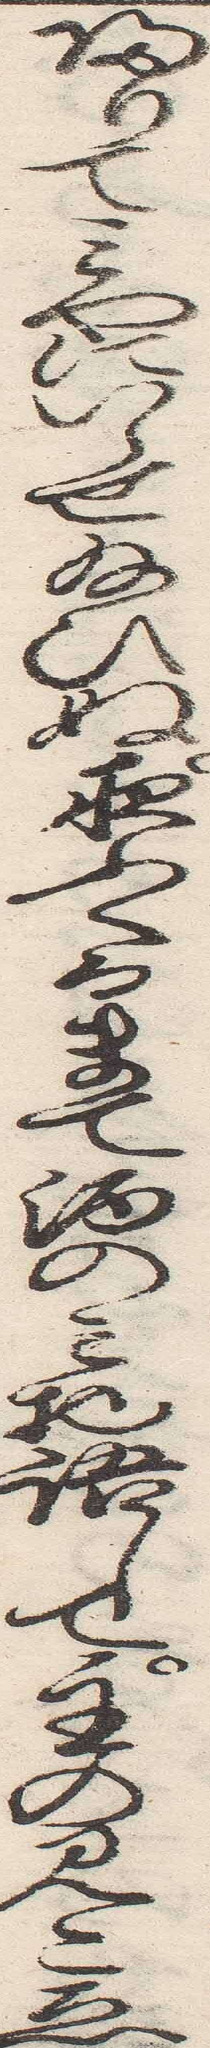帰りてみやにいらせ給ひぬ。夜ふくるまて酒のみ物語して。主のみこゑ
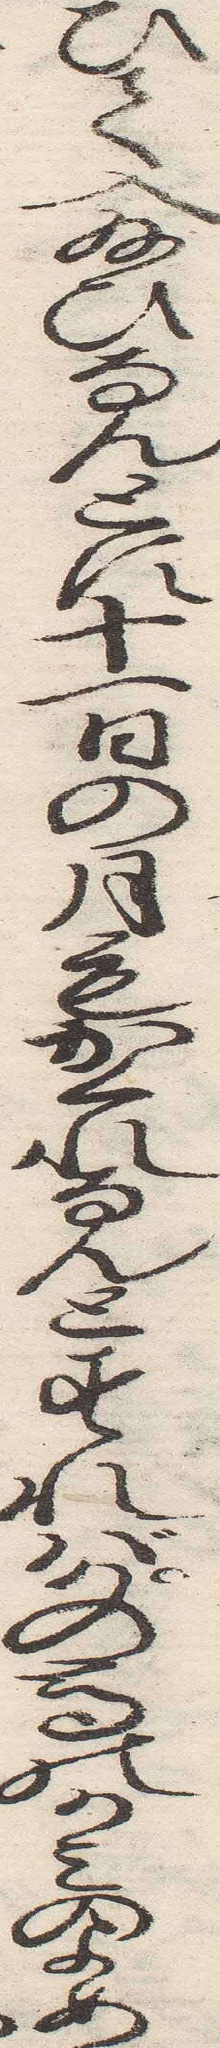ひて入給ひなんとす十一日の月もかくれなんとすれば。かの馬のかみのよめる
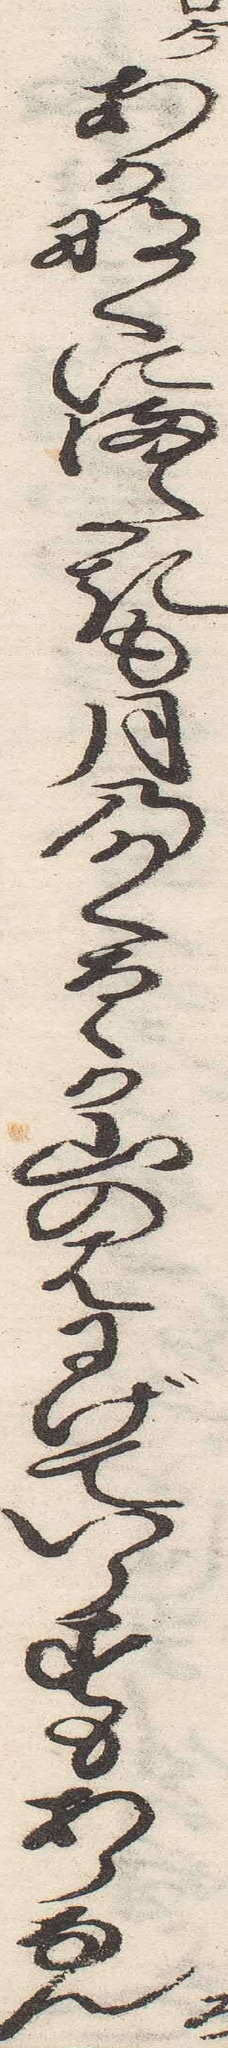古今あかなくにまたきも月のかくるゝか山のはにげていらすもあらなん
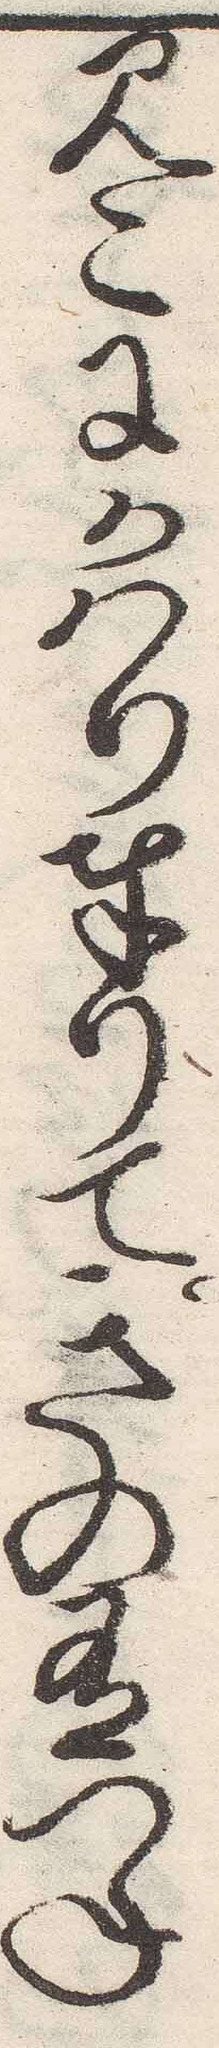みこにかはり奉りて。きの有つね
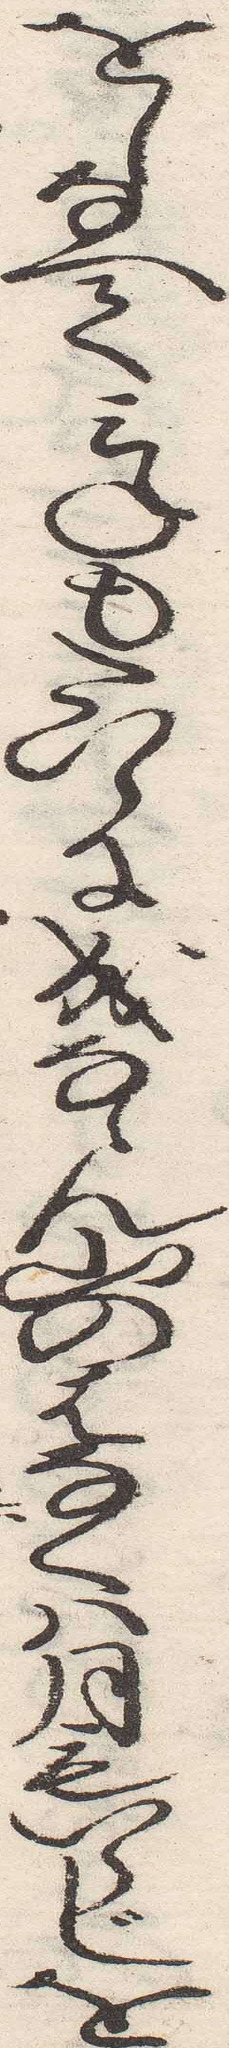をしなへてみねもたひらに成なゝん山のはなくは月もいらじを
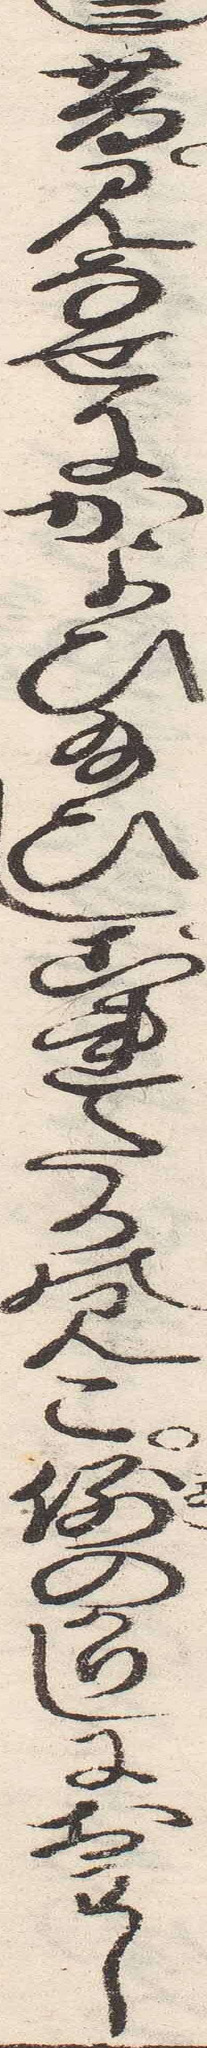八十三昔。みなせにかよひ給ひし。これたかのみこ。例のかりしにおわし
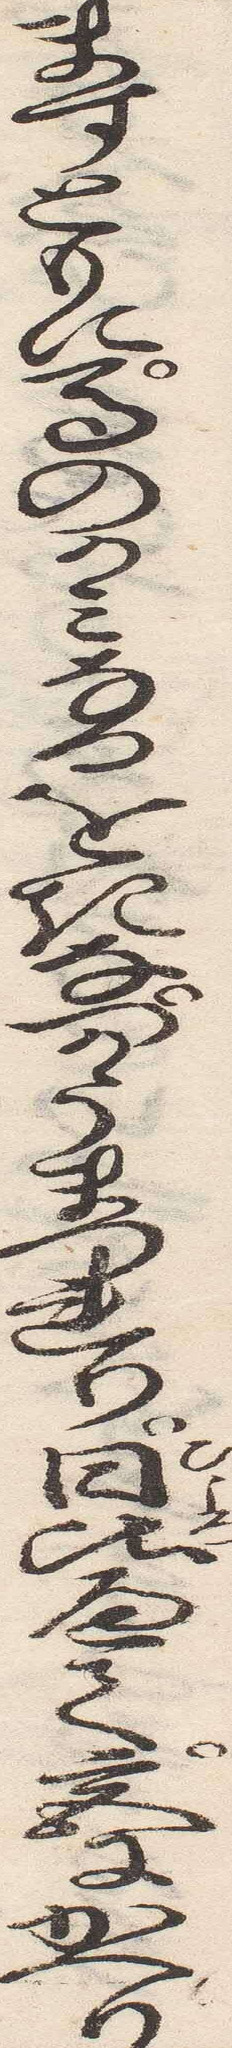ますともに。馬のかみなるをきな。つかうまつれり。日比へて。宮にかへり
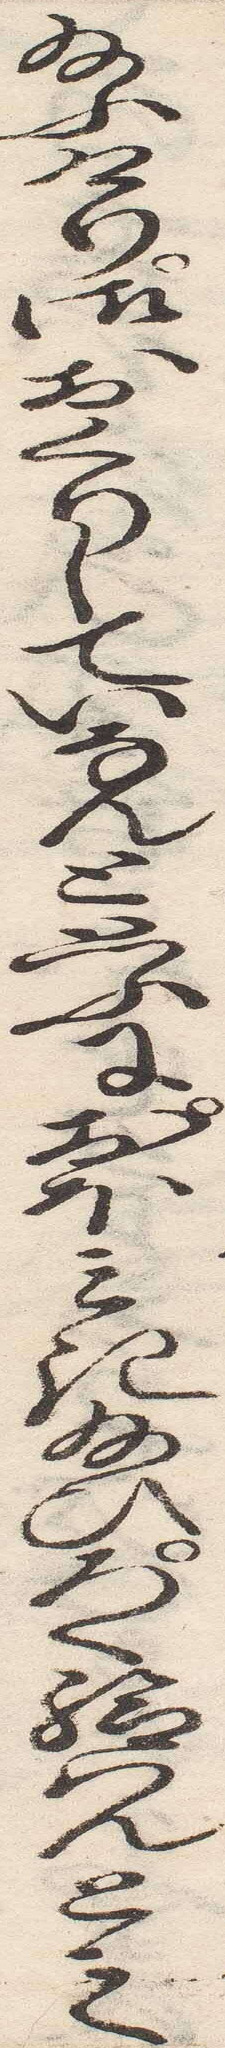給ふけり。御おくりしていなんと思ふに。おほみき給ひ。ろく給はんとて
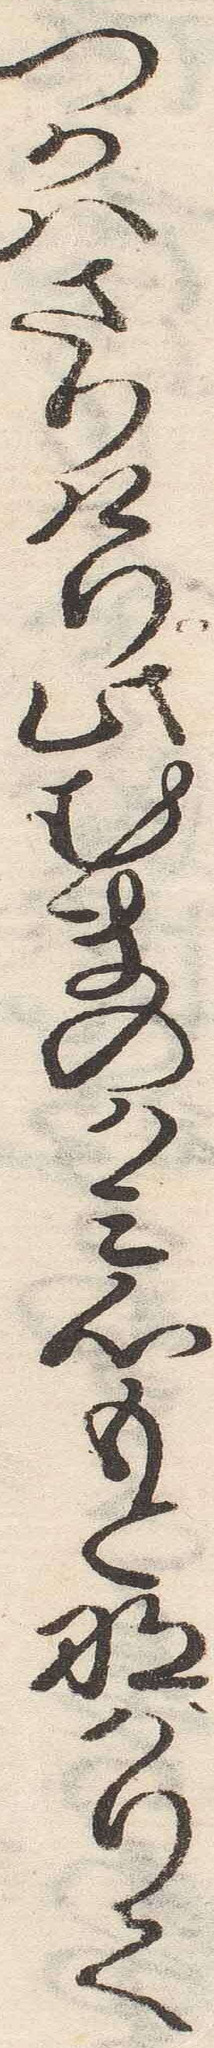つかはさりけり。此むまのかみ心もとながりて
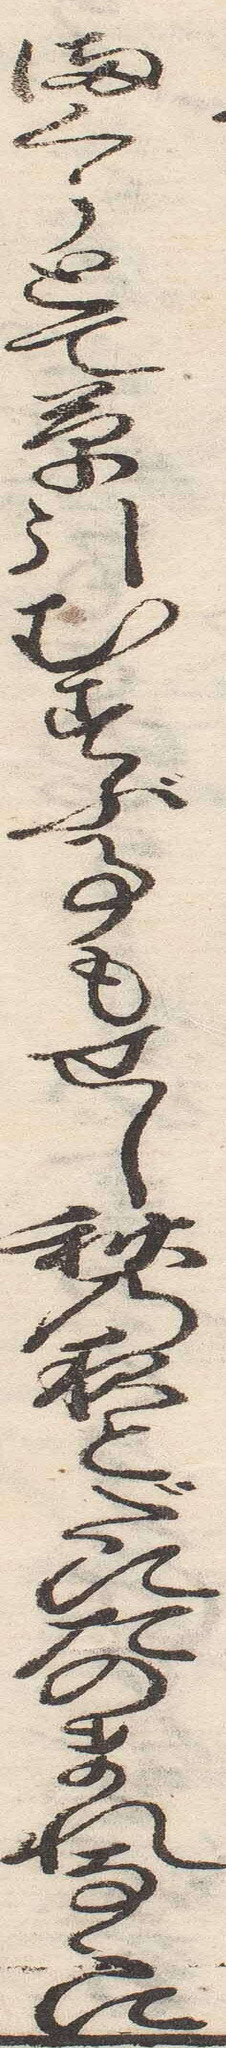まくらとて草引むすぶ事もせし秋の夜とだにたのまれなくに
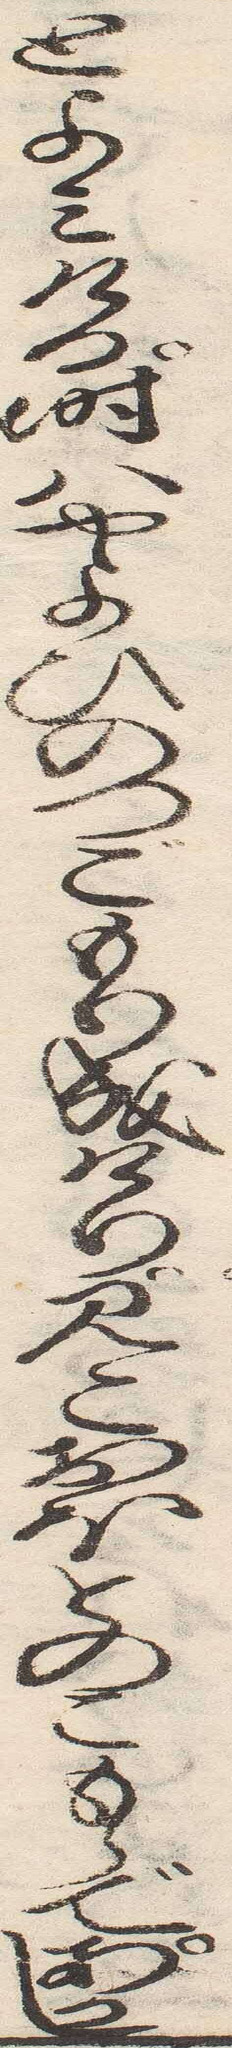とよみける。時はやよひのつごもり成けり。みこおほとのこもらで。あかし
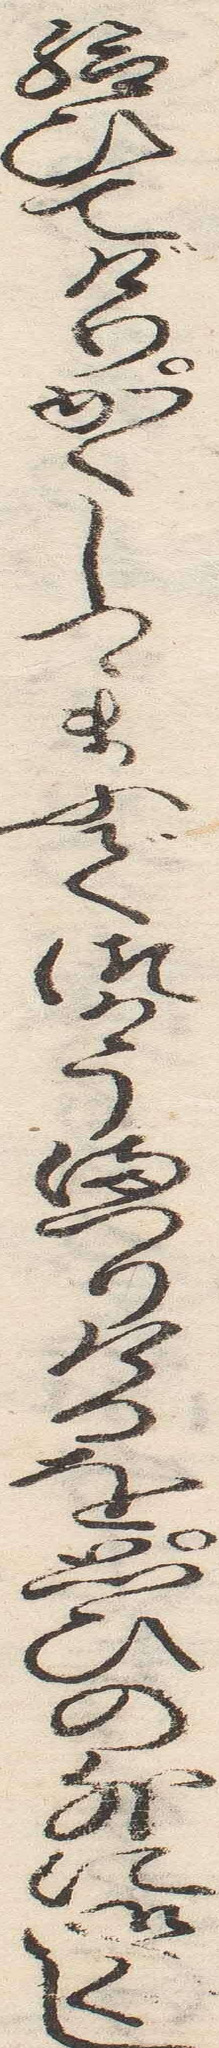給ひてげり。かくしつゝまふでつかうまつりけるを。思ひの外に御くし
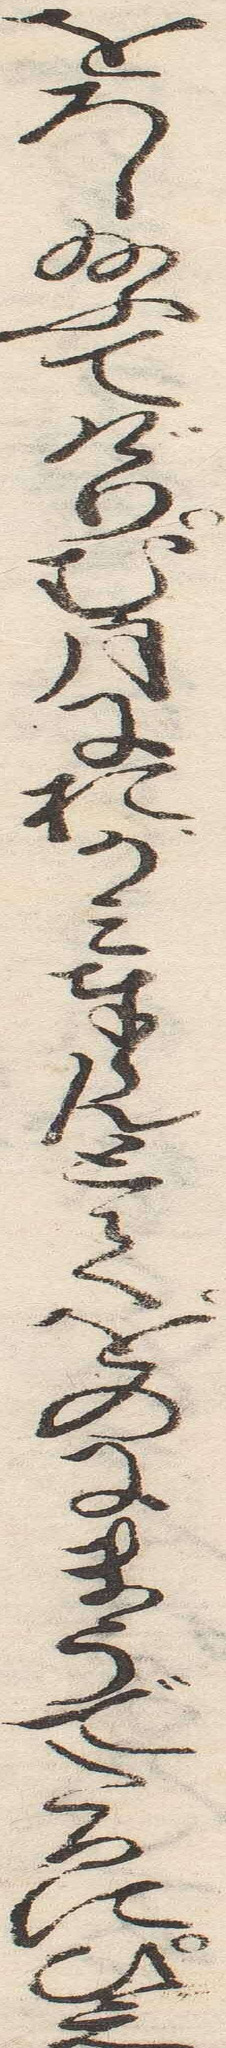をろし給ふてげり。む月におがみ奉らんとて。をのにまうでたるに。ひえ
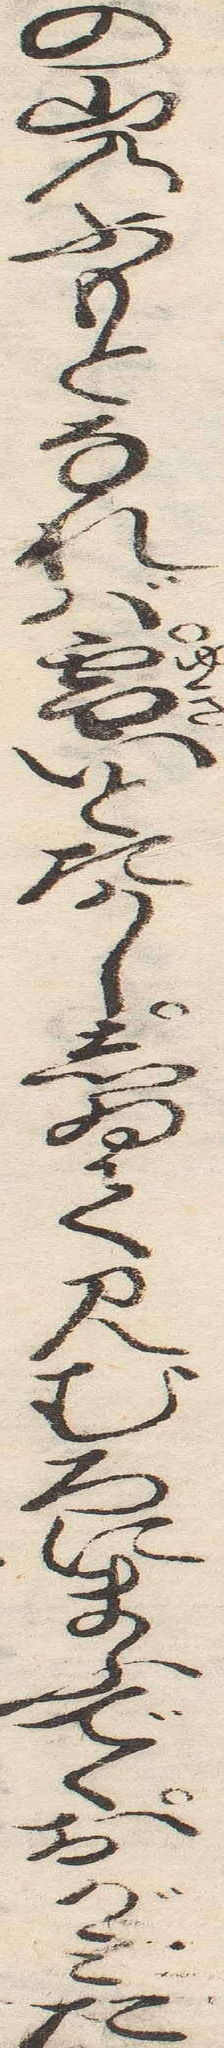の山のふもとなれば。雪いとたかし。しゐてみむろにまふでゝ。おがみた
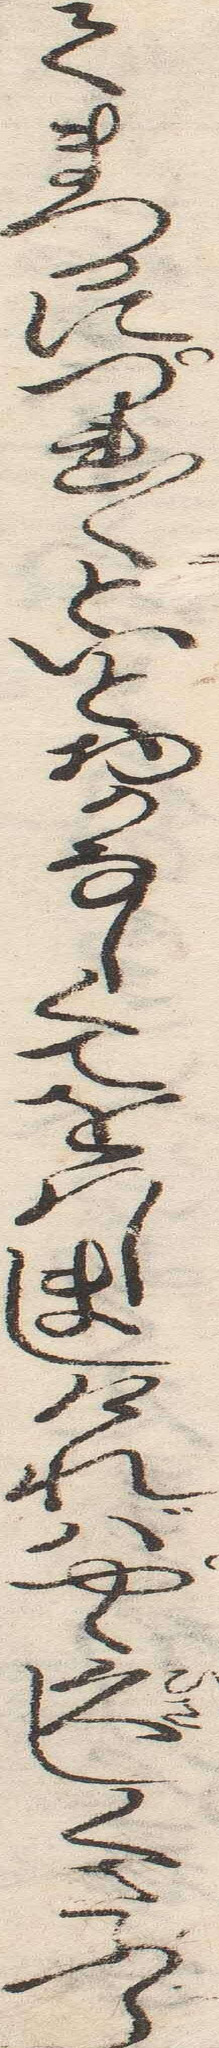てまつるに。つれ〳〵といと物かなしくてをはしましければ。やゝ久しくさふら
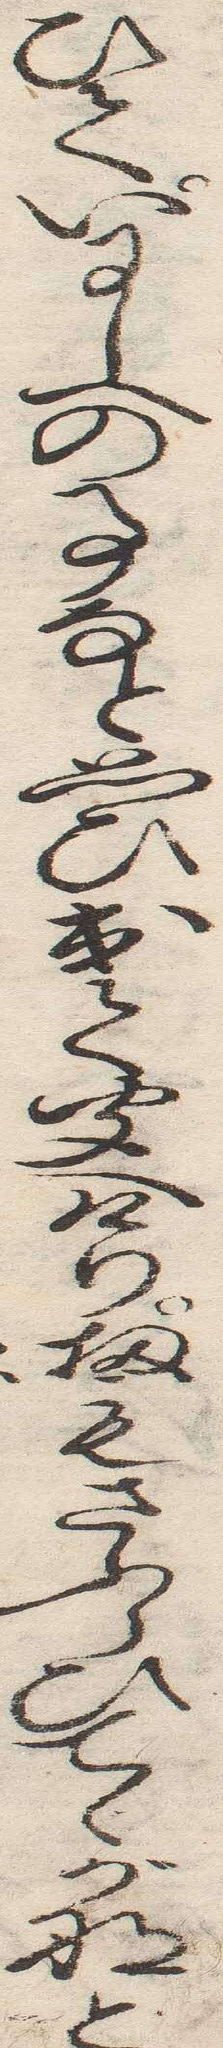ひて。いにしへの事なと思ひ出て聞へけり。扨もさふらひてしがなと
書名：伊勢物語
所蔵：東京学芸大学附属図書館 国文学研究資料館
